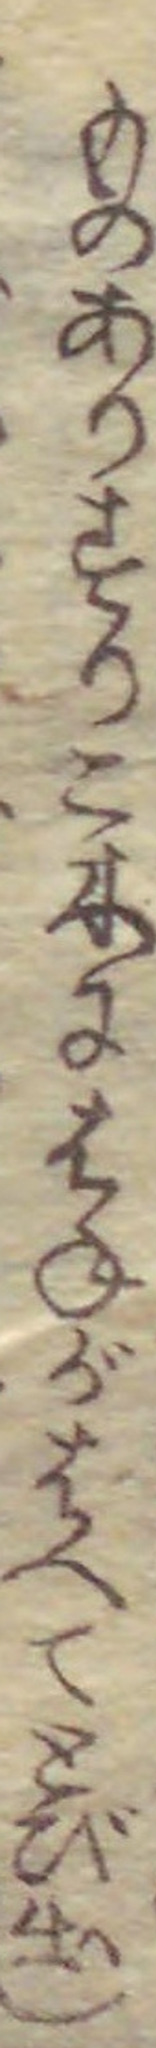ものありすりこ木にはねがはへてとび出し
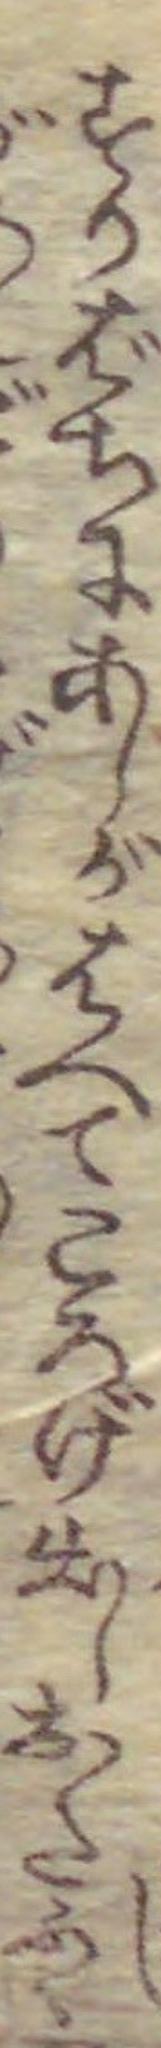すりばちにあしがはへてころげ出しおたふく
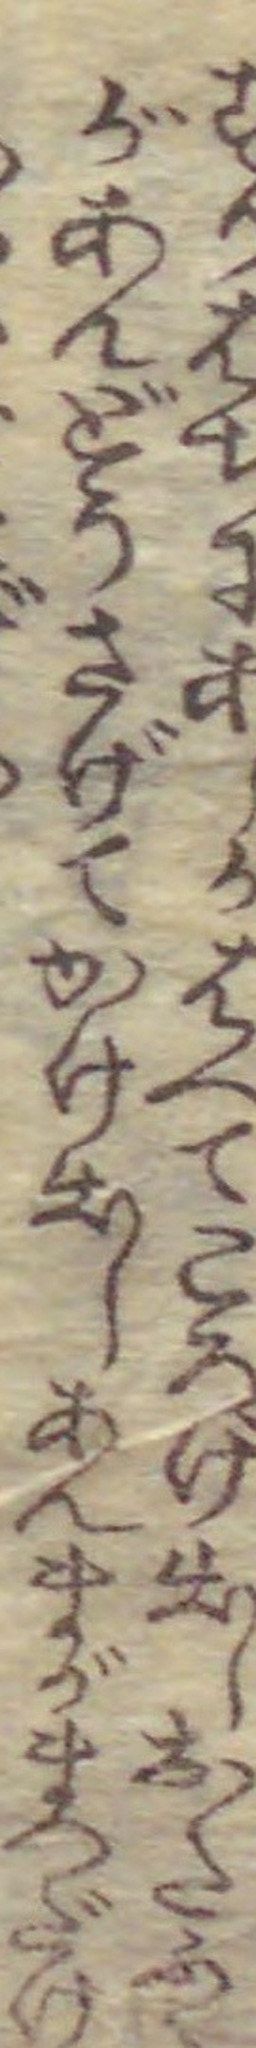があんどうさげてかけ出しあんまがまつだけ
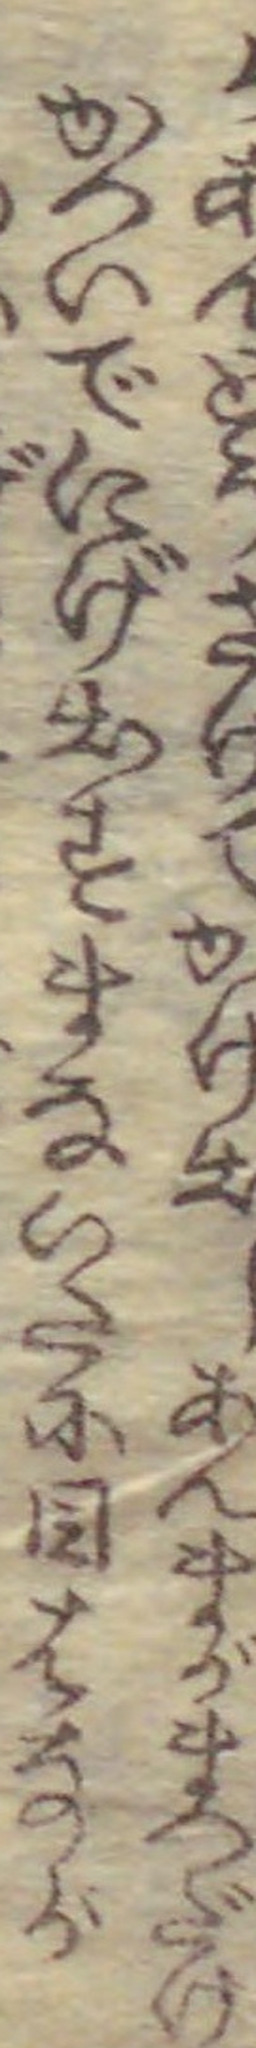かついでにげ出すまないたに目はなが
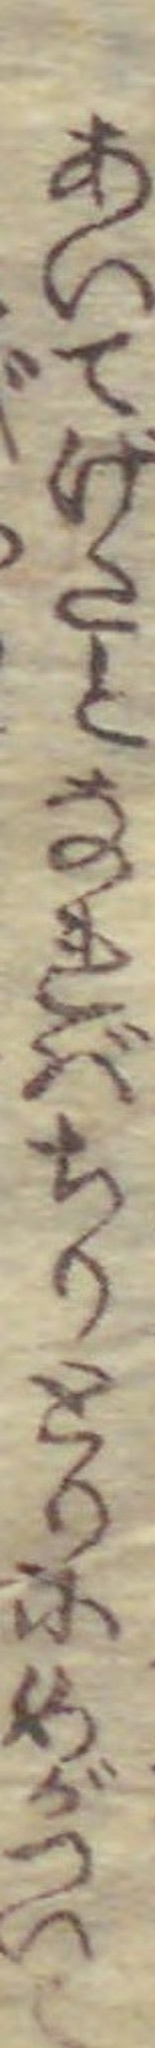あいてげたとなればちりとりにめがついて
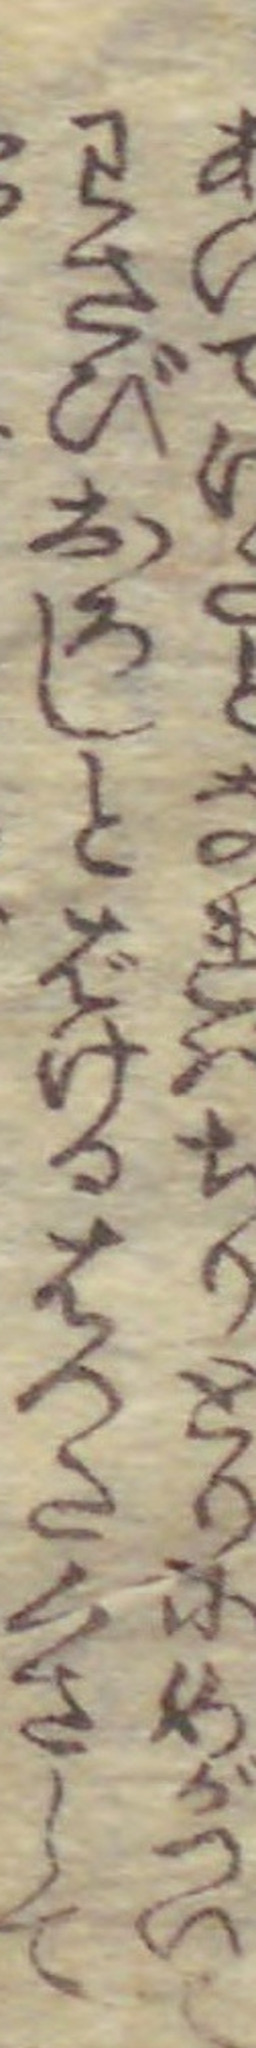わさびおろしとばけるはつたくさして
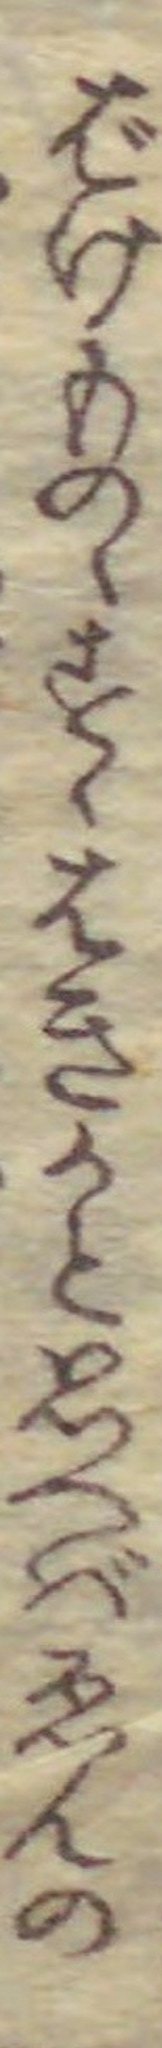ばけものゝすゝはきかと思へばゑんの
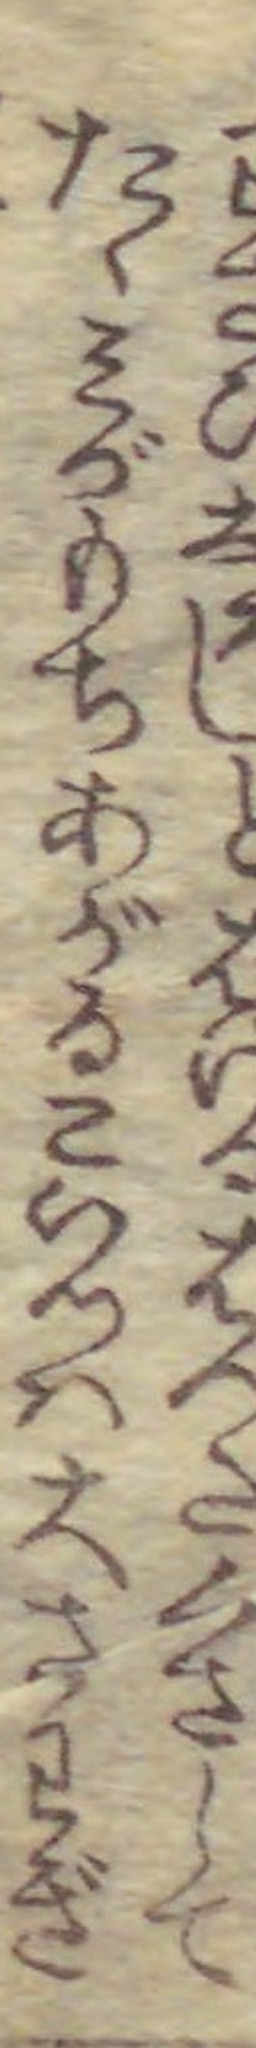たゝみがもちあがるこいつは大さわぎ
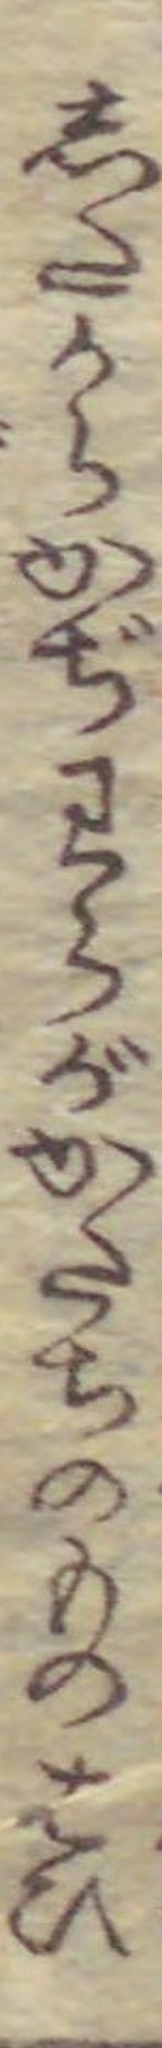したからかぢわらがかたちのものはひ
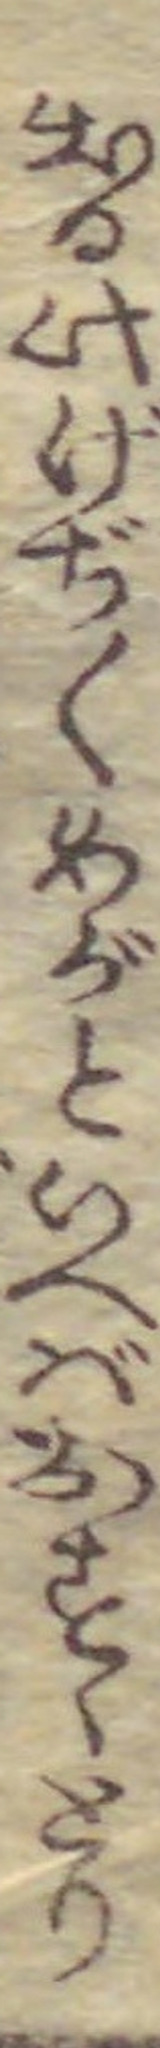出る此げぢ〳〵めがといへばおすゝとり
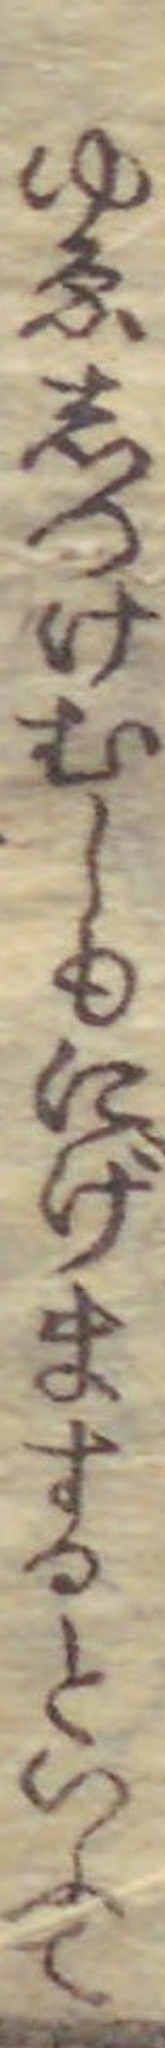ゆゑしつけむしもにげまするといふて
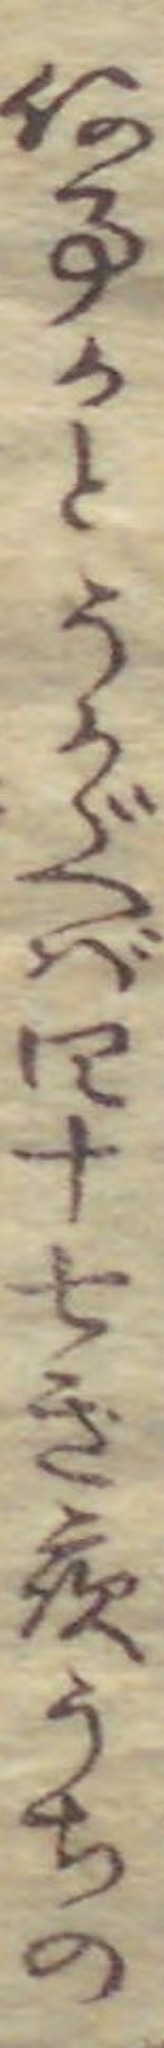何事かとうかゞへば四十七き夜うちの
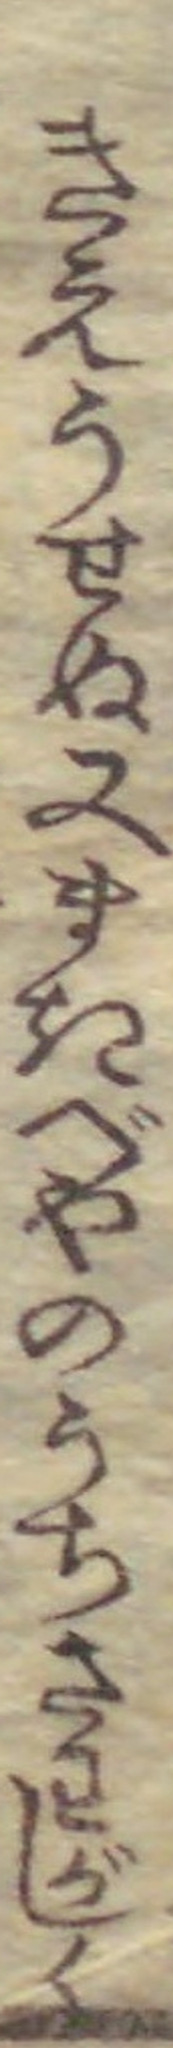きへうせぬ又まきべやのうちさわがしく
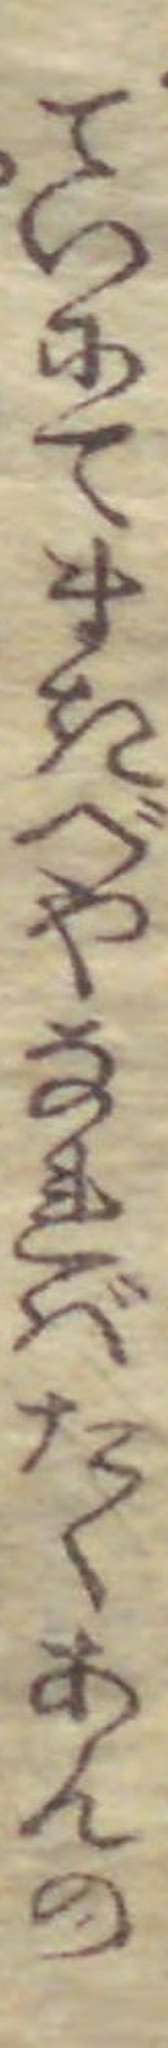ていにてまきべやなればたくあんの
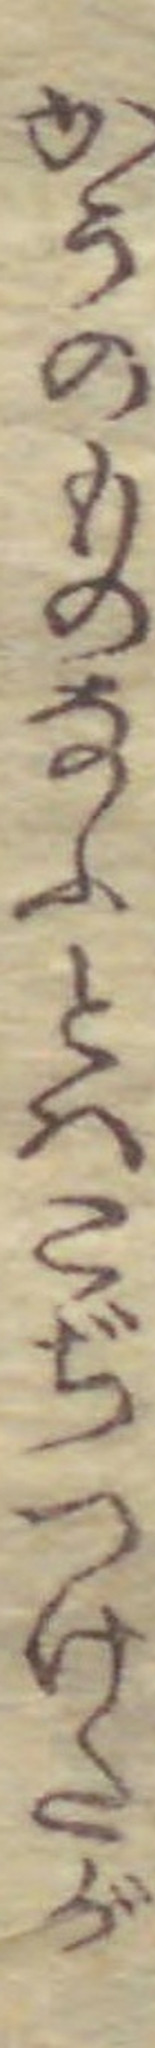かうのものなにとはこぢつけたが
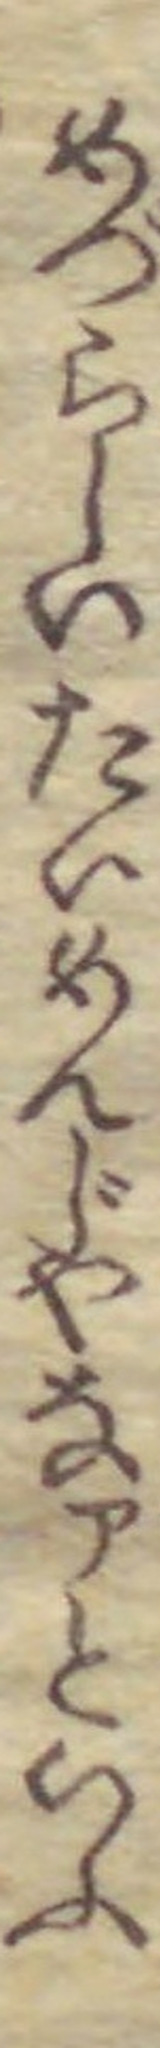めづらしいたいめんじやなァといふ
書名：大時代唐土化物 3巻. 曽我太夫染
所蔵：国立国会図書館 National Diet Library, JAPAN
